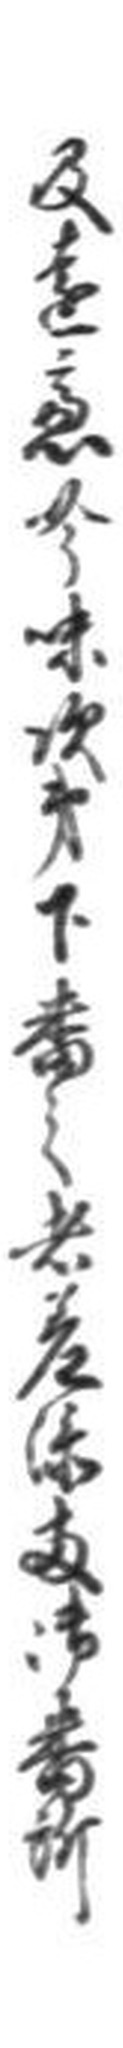及遠慮吟味次第下番之者差添両御番所
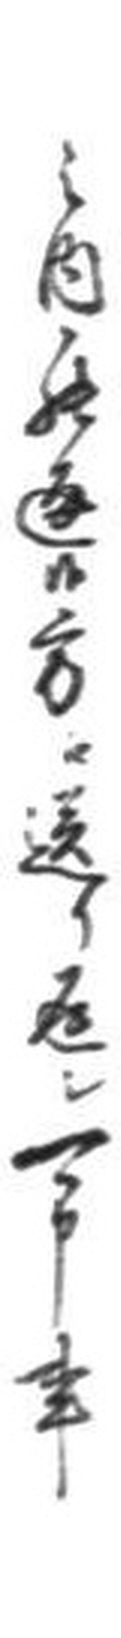之内罷通候方江送り返シ可申事
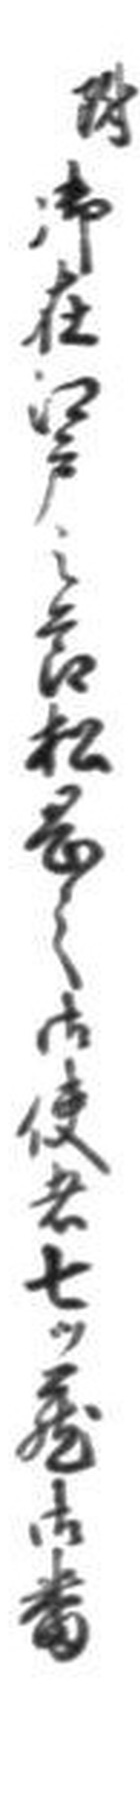御在江戸之節松岡之御使者七ツ蔵御番
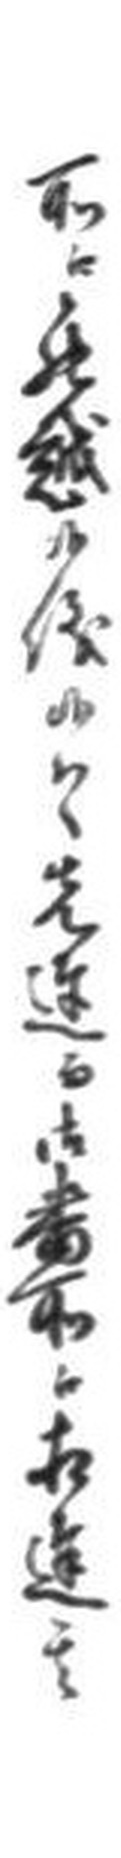所江罷越候儀候ハヽ先達而御番所江相達其
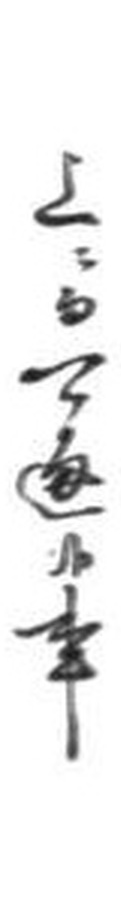上ニ而可通候事

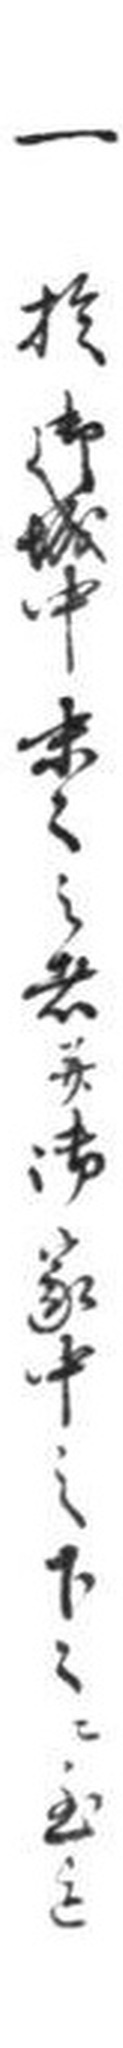一於御城中末々之者并御家中之下々ニ至迄
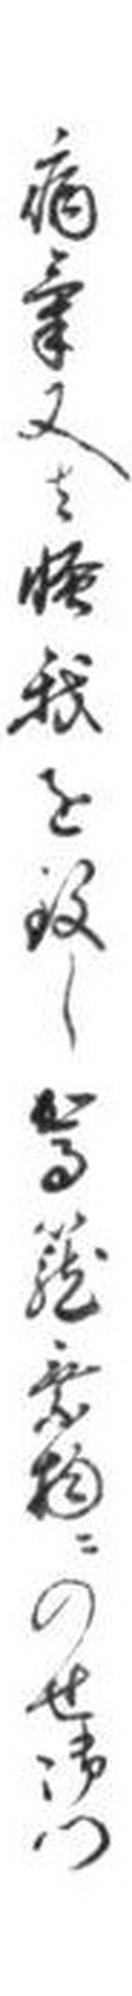病気又者怪我を致し駕籠乗物ニのせ御門
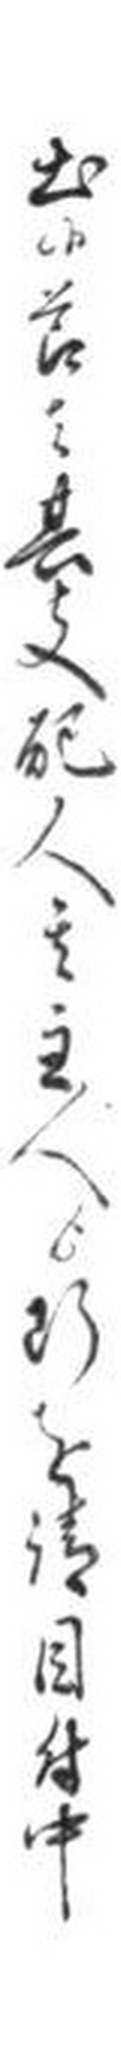出候節者其支配人其主人ゟ断を請目付中
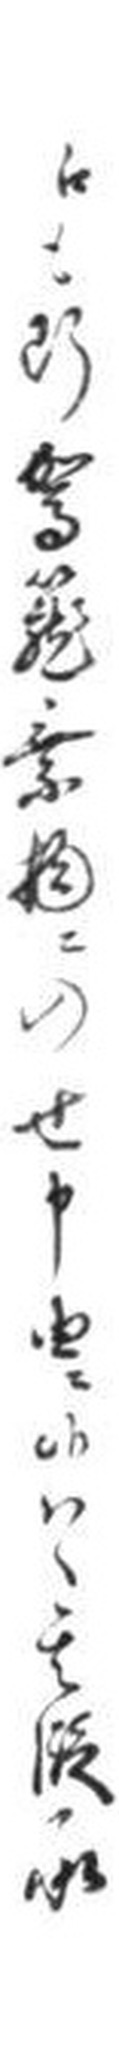江も断駕籠乗物ニのせ申由ニ候ハヽ其段承
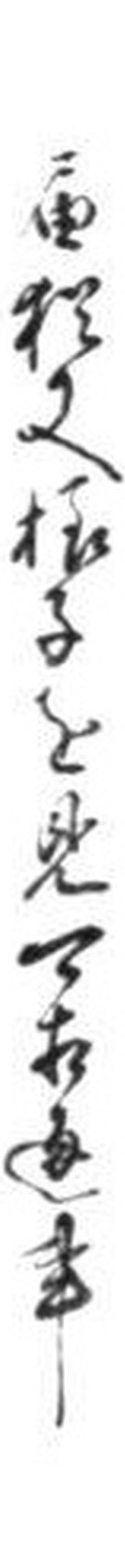届猶又様子を見可相通事
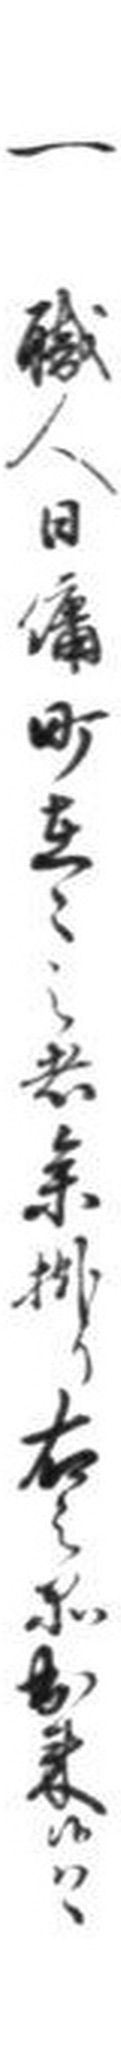一職人日傭町在々之者参掛り右之品出来候ハヽ
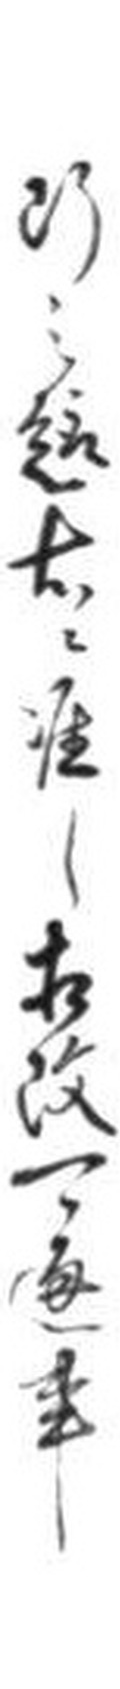断之趣右ニ准し相改可通事
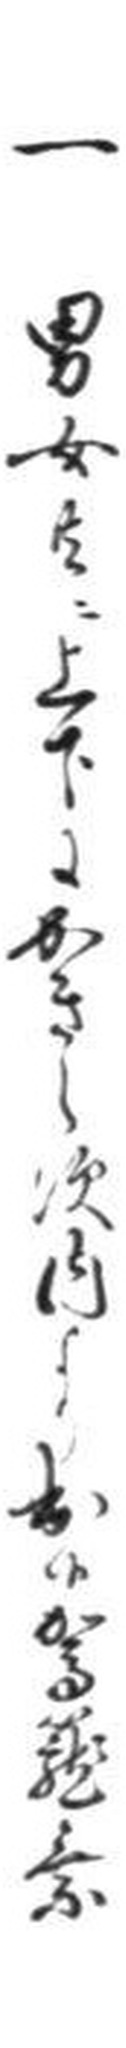一男女共ニ上下にかきらす内より出候駕籠乗
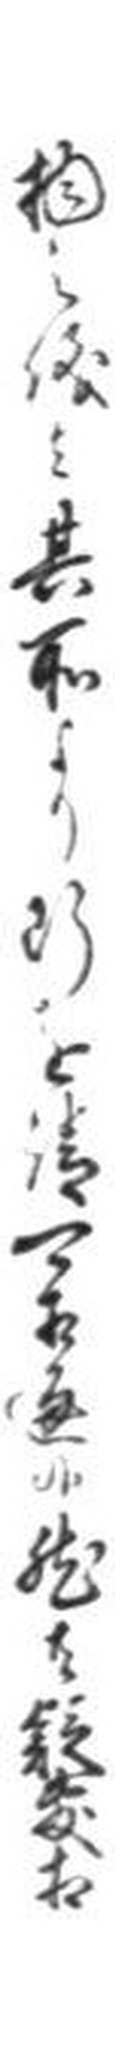物之儀者其所より断を請可相通候然共疑敷相
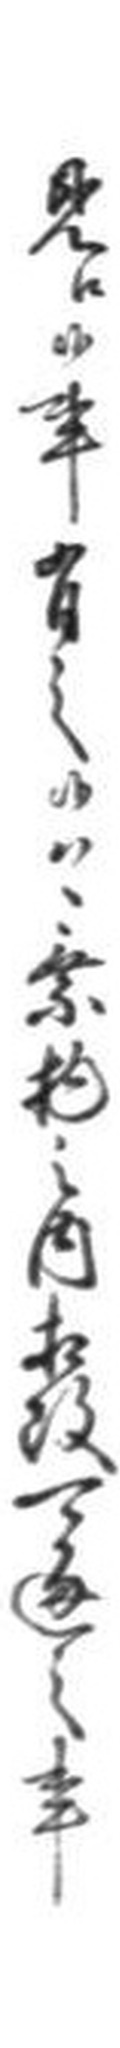見江候事有之候ハヽ乗物之内相改可通之事
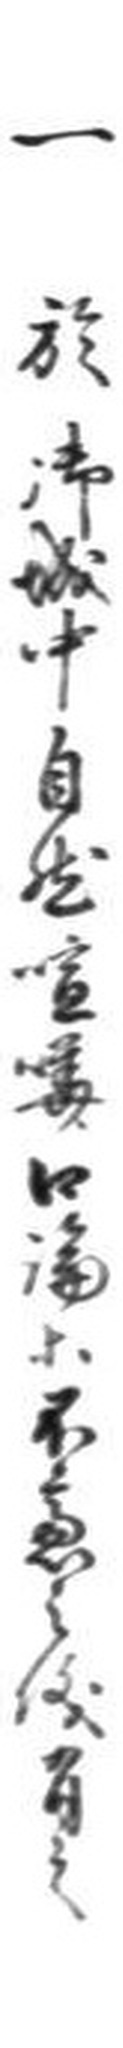一於御城中自然喧嘩口論等不慮之儀有之
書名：家譜 三十三 吉邦公 享保四年
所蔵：福井県文書館 Fukui Prefectural Archives
